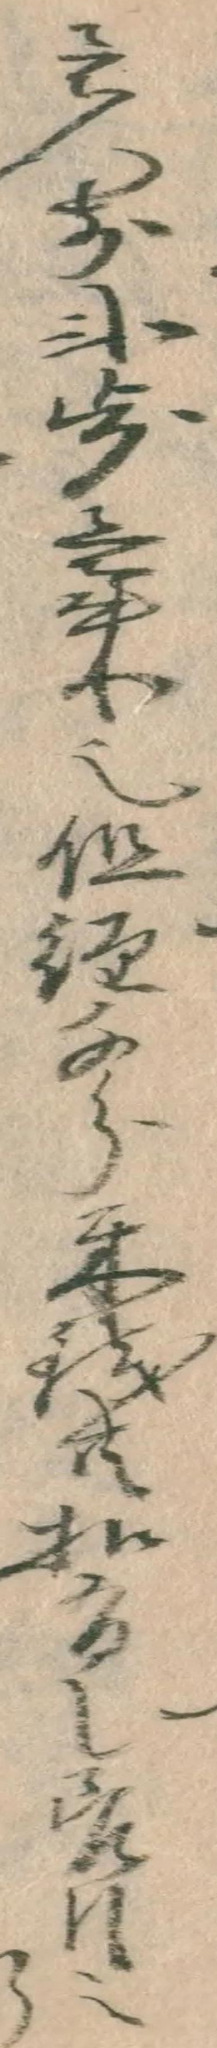壱人前弐歩壱升也但経千分米銭共扣有之差引之了
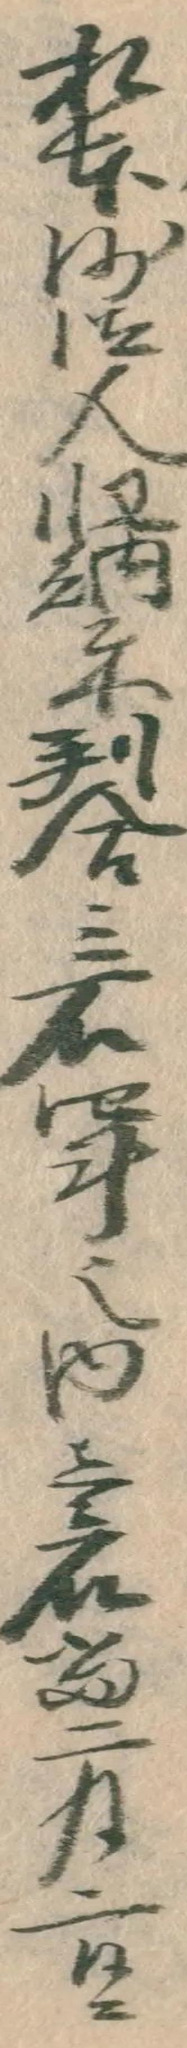札元沙汰人収納米判合三石四斗之内壱石當二月二日ニ
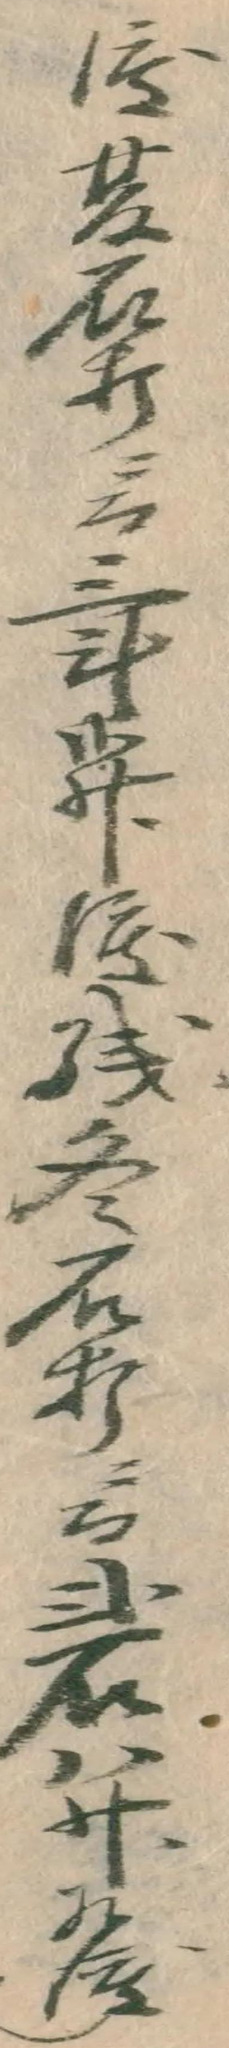渡夏石打ニ而三斗弐升渡残冬石拾ニ而弐石八升相渡也
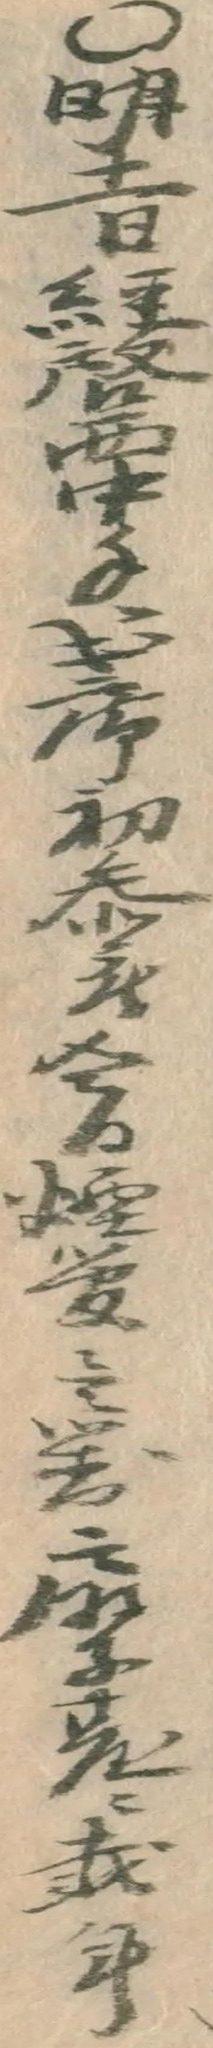○明十一日経啓西中手へ出席初参ニ付今日煙管壱器扇子䑓ニ載年

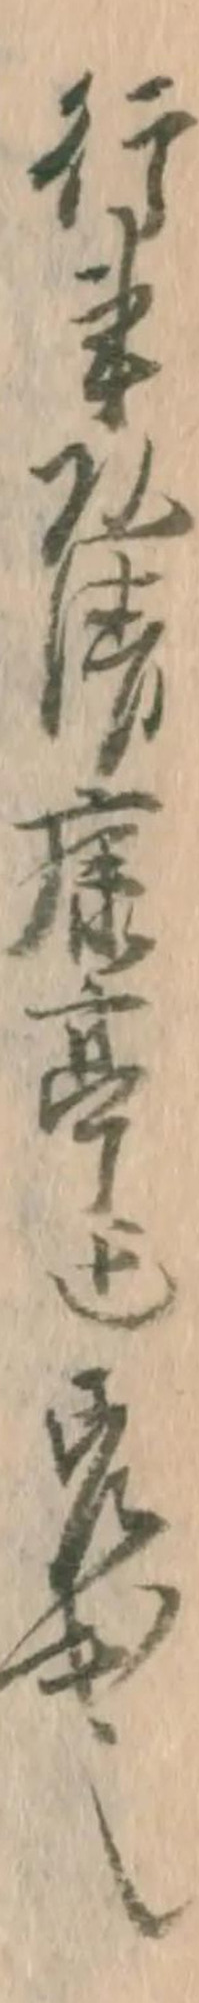行事頭清康亭迄差出也
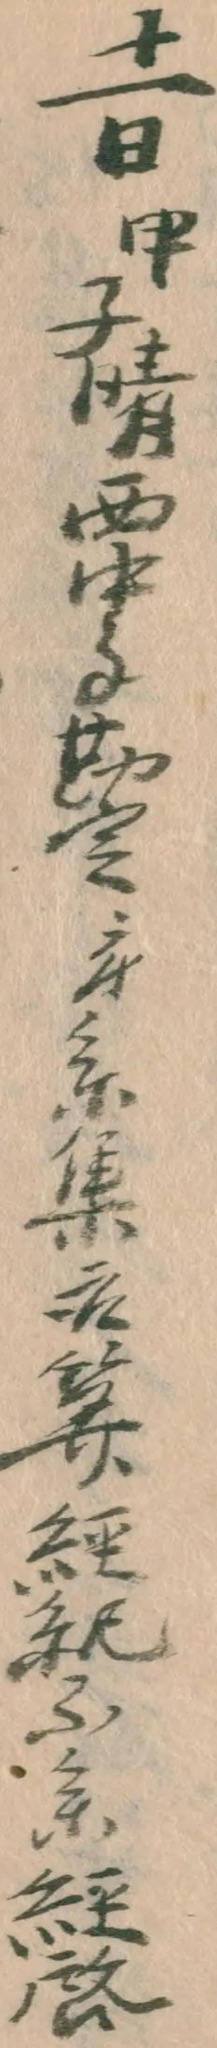十一日甲子晴西中手勘定ニ付参集取算経紀不参経啓
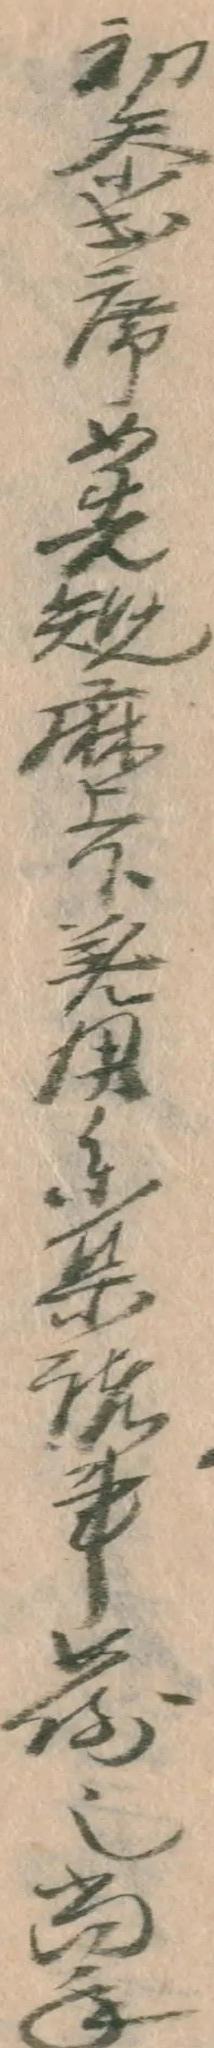初参出席如先規麻上下着用参集諸事如例也當年
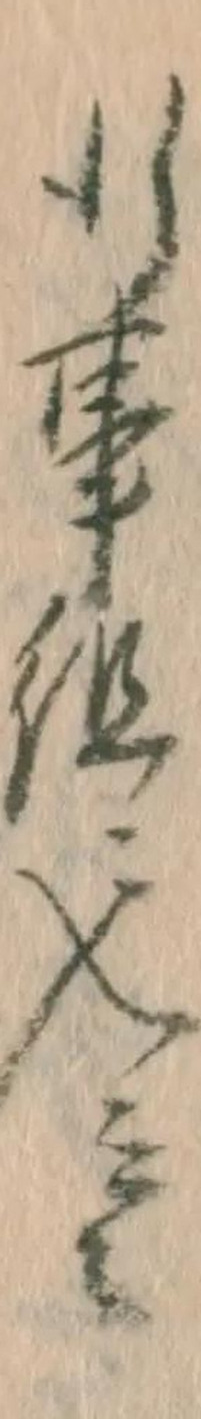行事組ニ入云々
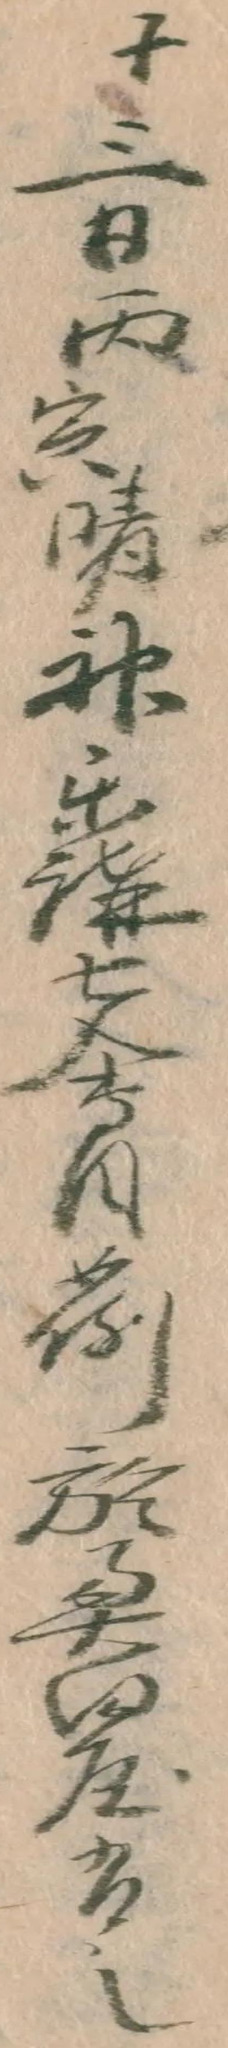十三日丙寅神楽講七會目如例於奥田屋有之
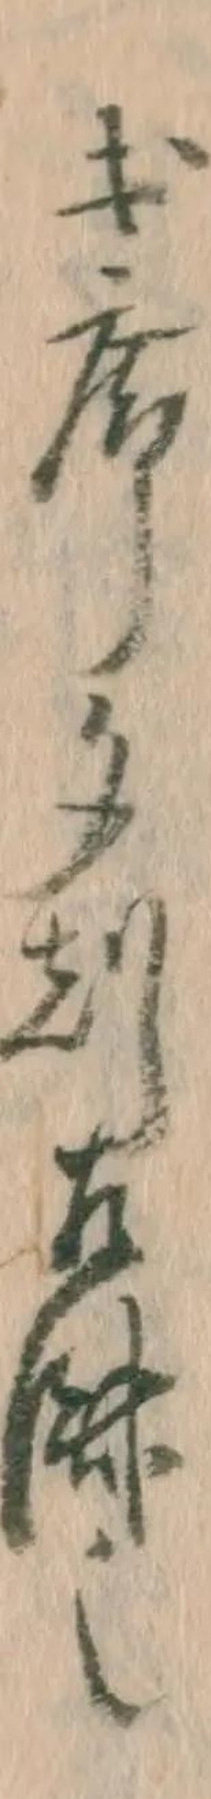出席夕刻相済也
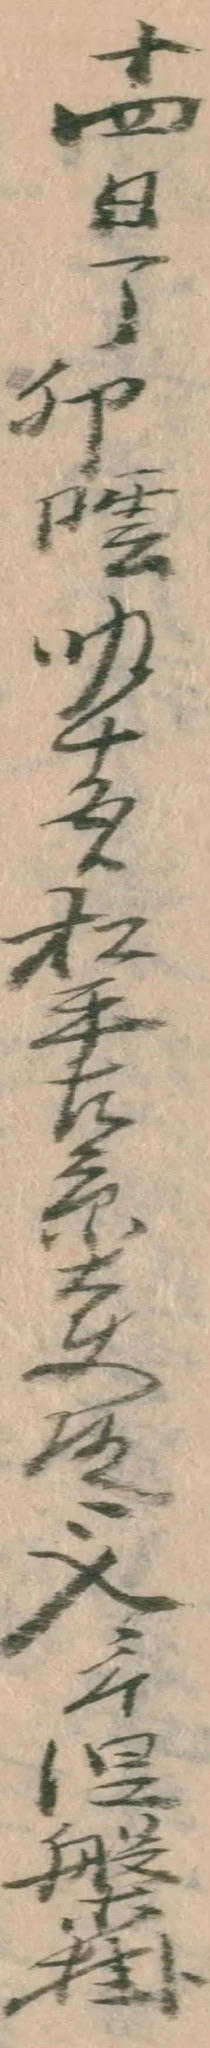十四日丁卯曇明十五日松平左京大夫殿御入ニ付涅槃掛
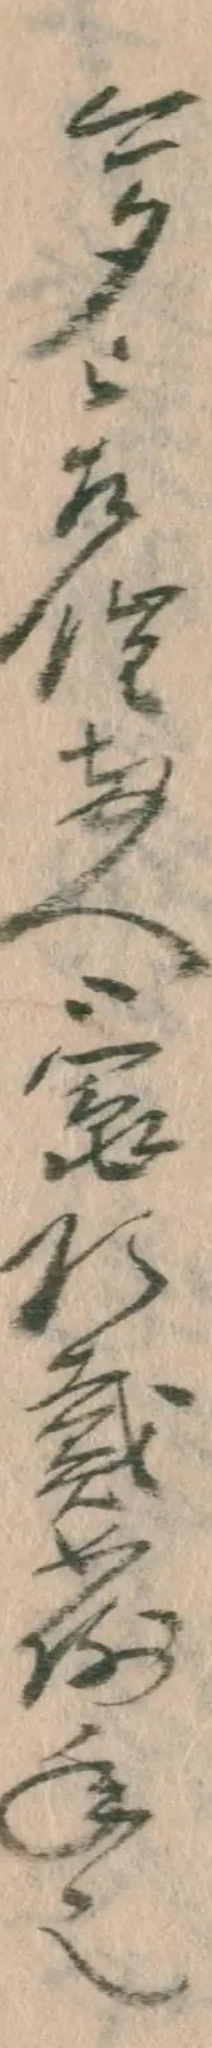今夕被相催両人御鬮頂戴如例年也
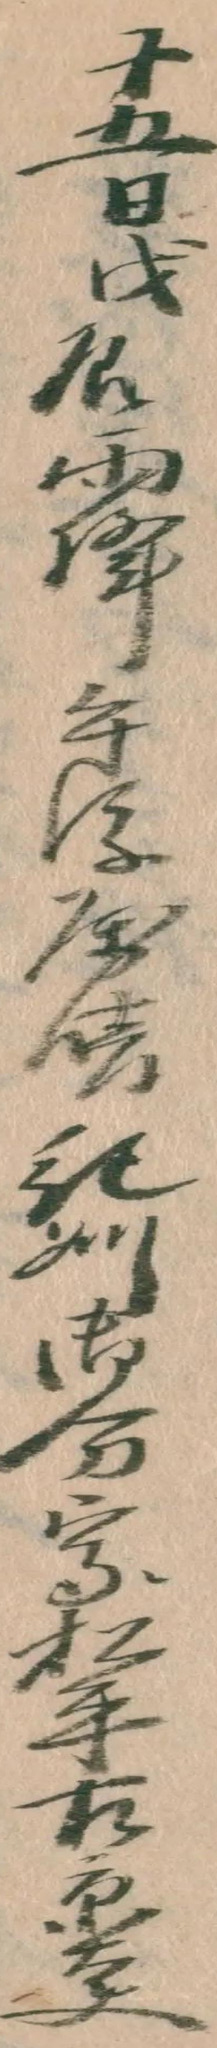十五日戊辰雨降午後属晴紀州御分高松平右京大夫
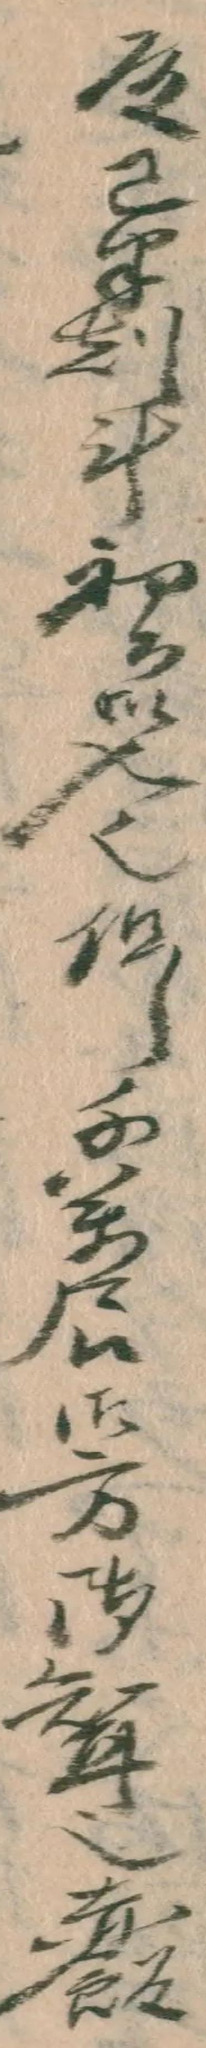殿巳半刻斗初而御入也但し千君御方御聟也赤飯
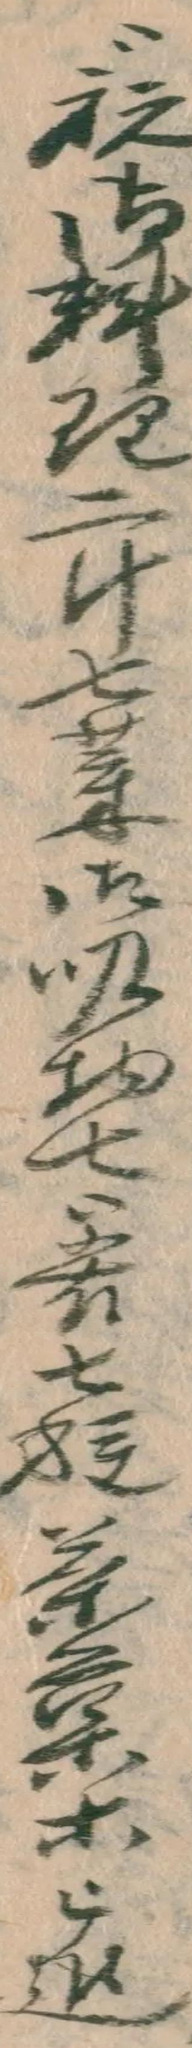御祝御料理二汁七菜御吸物七御肴七種茶菓等被進
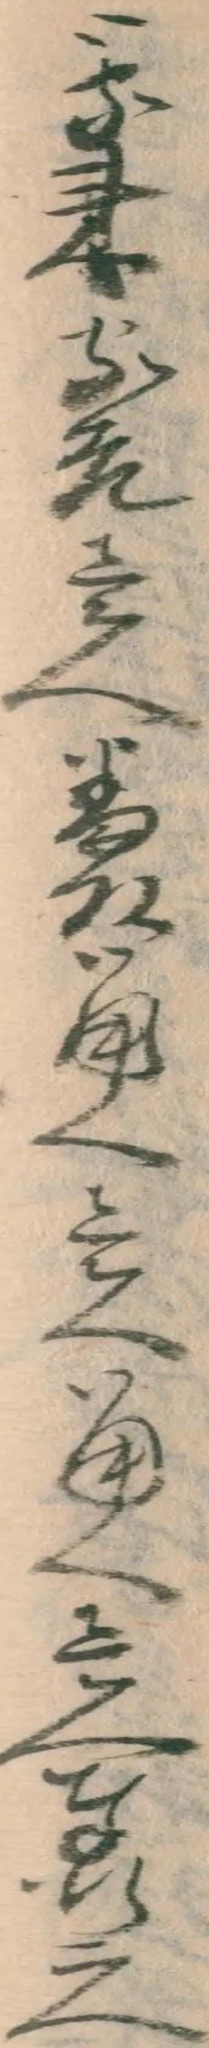御家来家老壱人番頭御用人壱人御用壱人奉行二人
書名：賀茂社記録. 第67冊
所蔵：国立国会図書館 National Diet Library, JAPAN
